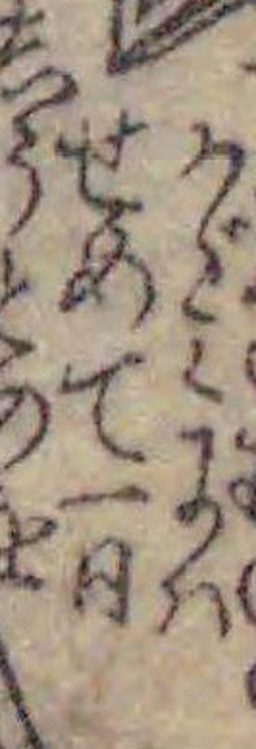しうとめを
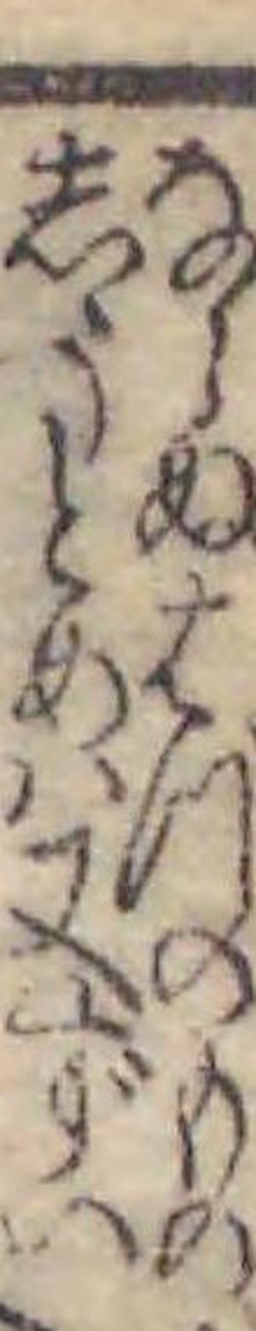しうとめは又ずい
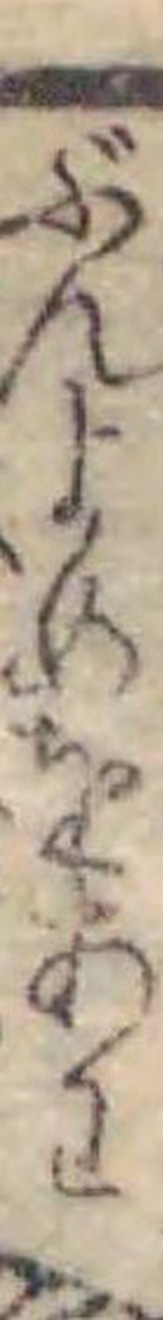ぶんよめをあわ
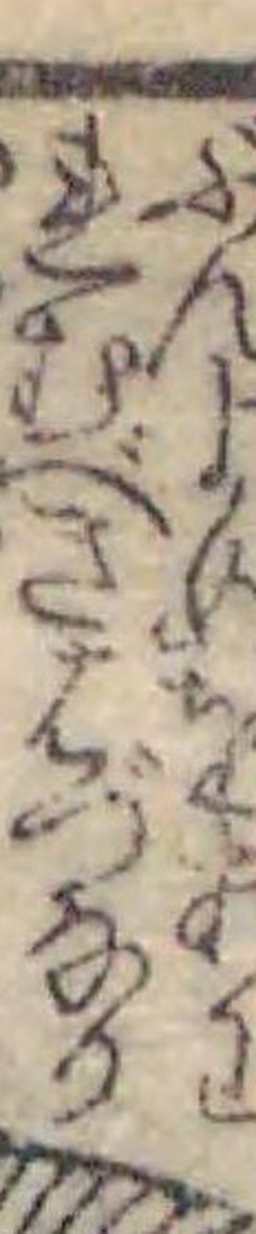れむべきはづなり
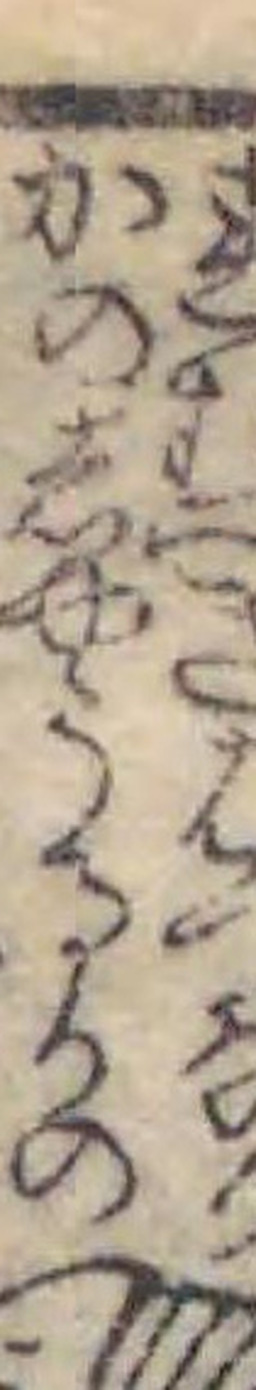かのしやうるりの
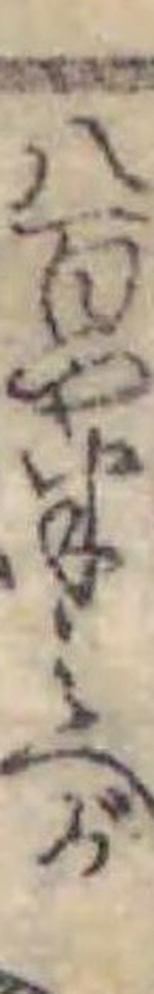八百や半兵へが
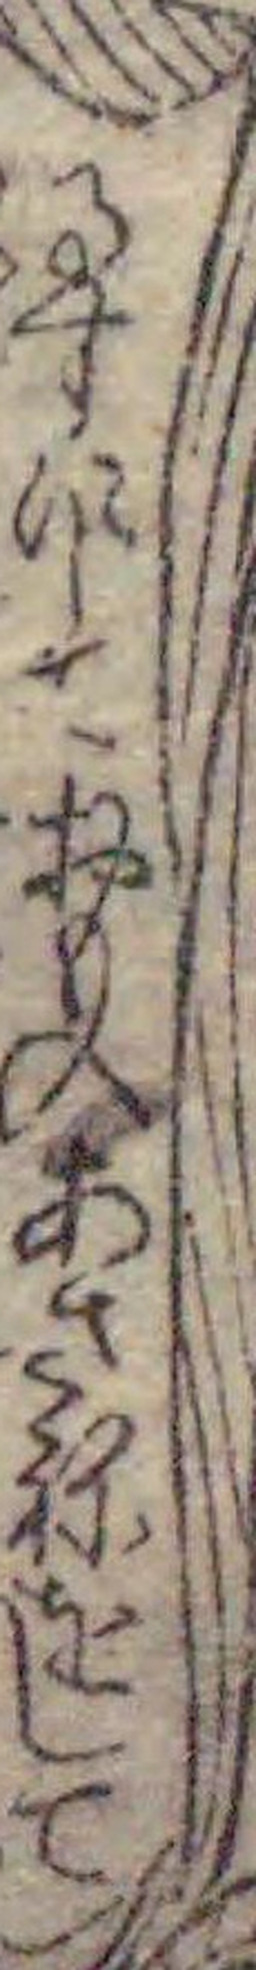るすにしておも入あさねをして
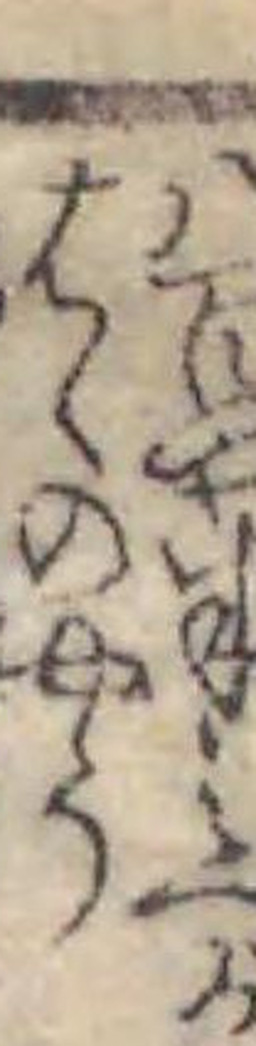はゝのやう
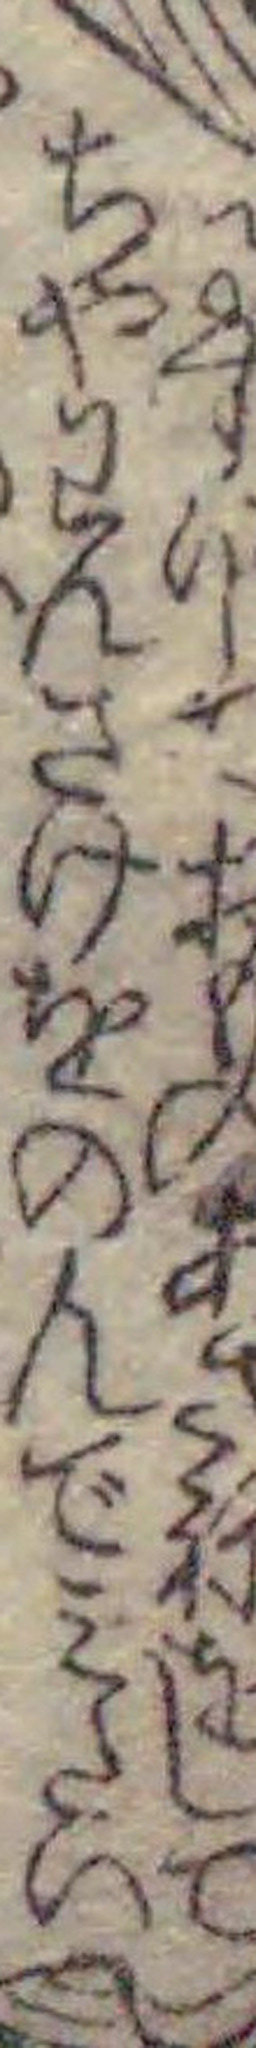ちやわんさけをのんでみたい
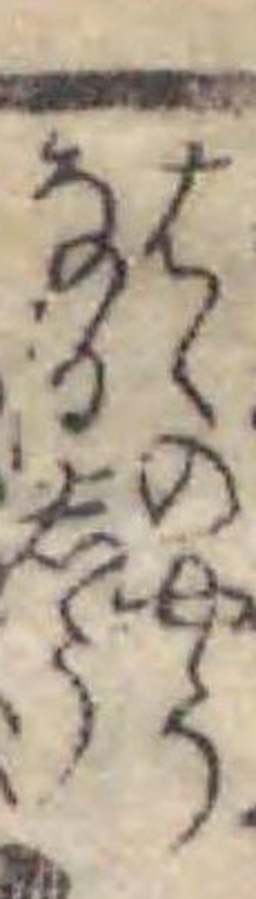なるしう
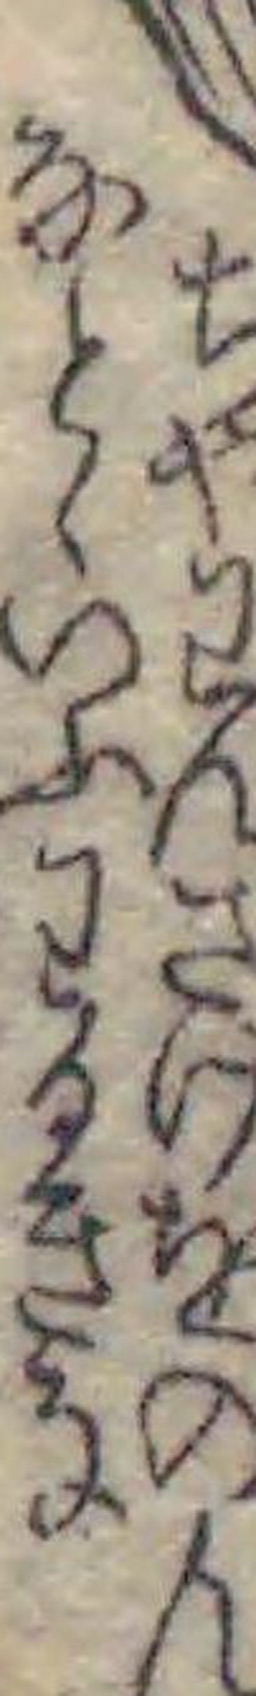なとゝいふわるきな
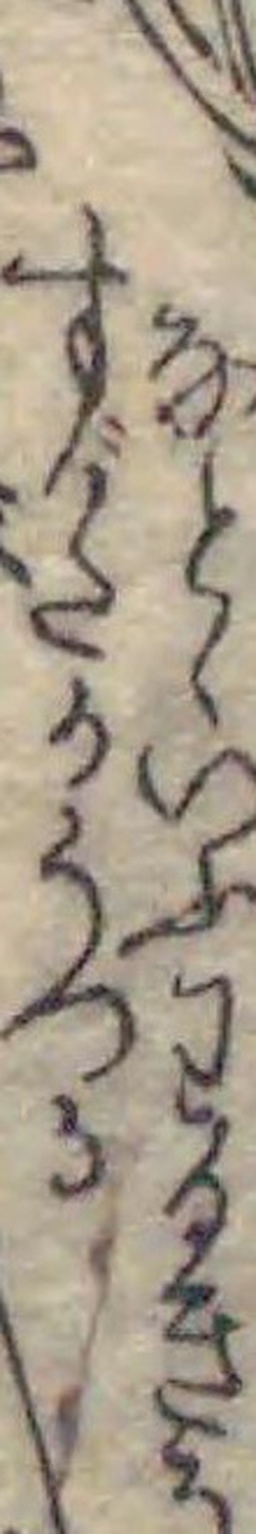すがたかうつる
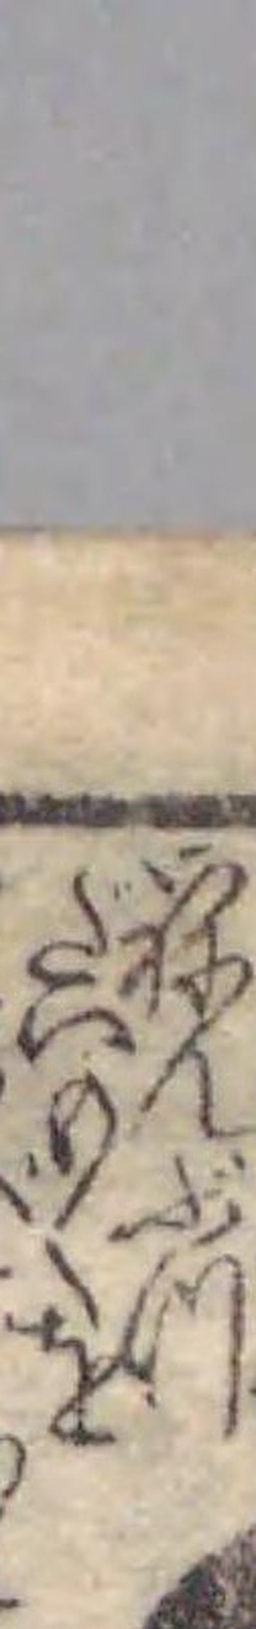だいもくを
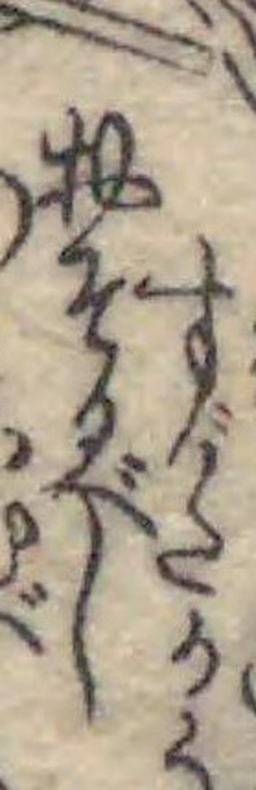おそるべし
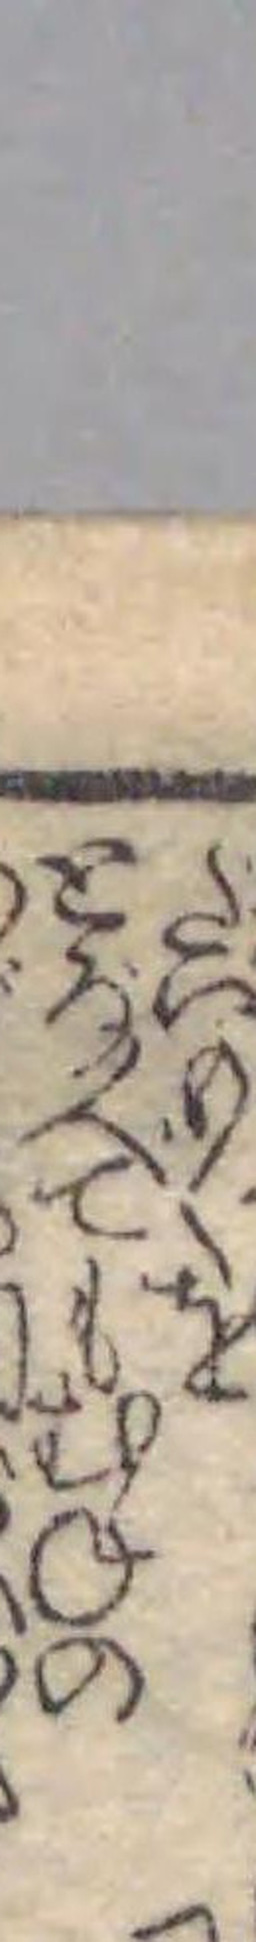となへてもむねの
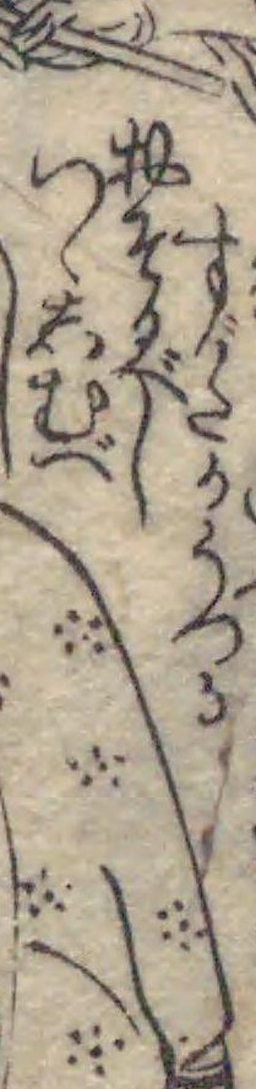つゝしむべ
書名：人心鏡写絵 : 3巻
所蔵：国立国会図書館 National Diet Library, JAPAN
